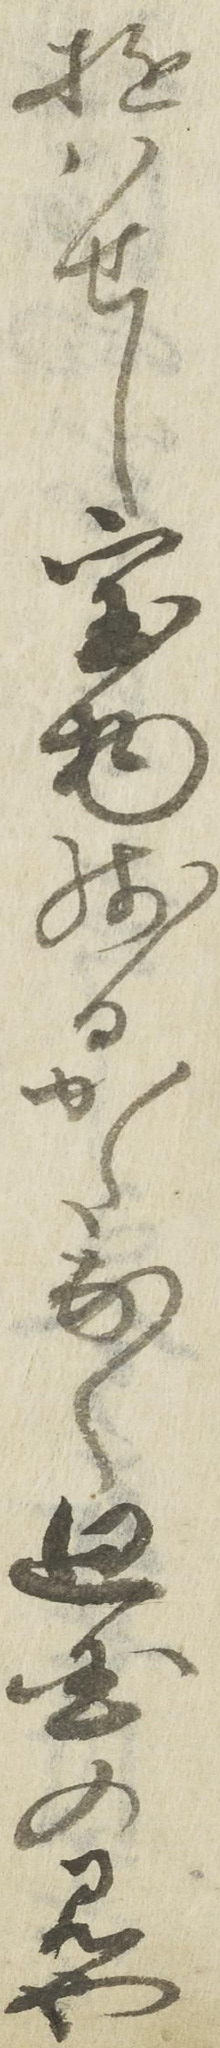遊はせし宝物残るかたなく廻国の見や
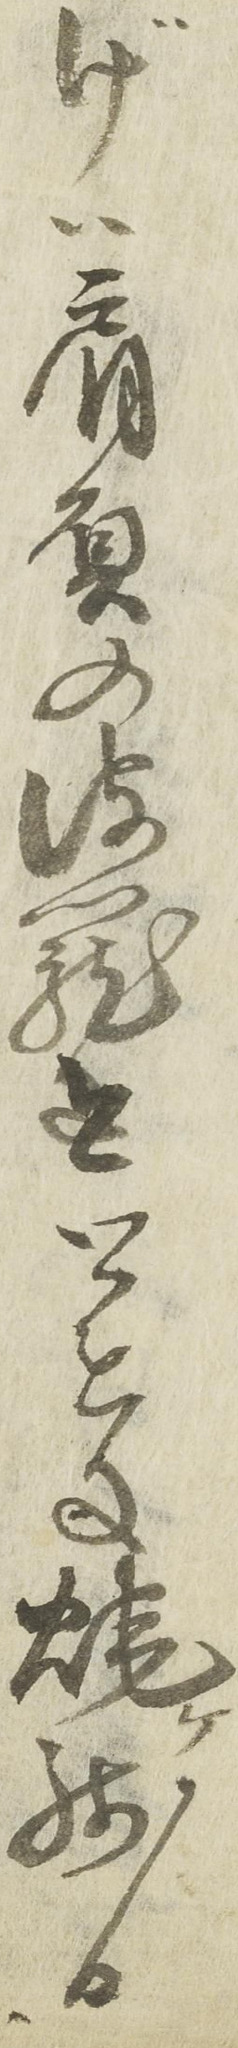げは肩負の皮籠とともに焼ケ残る
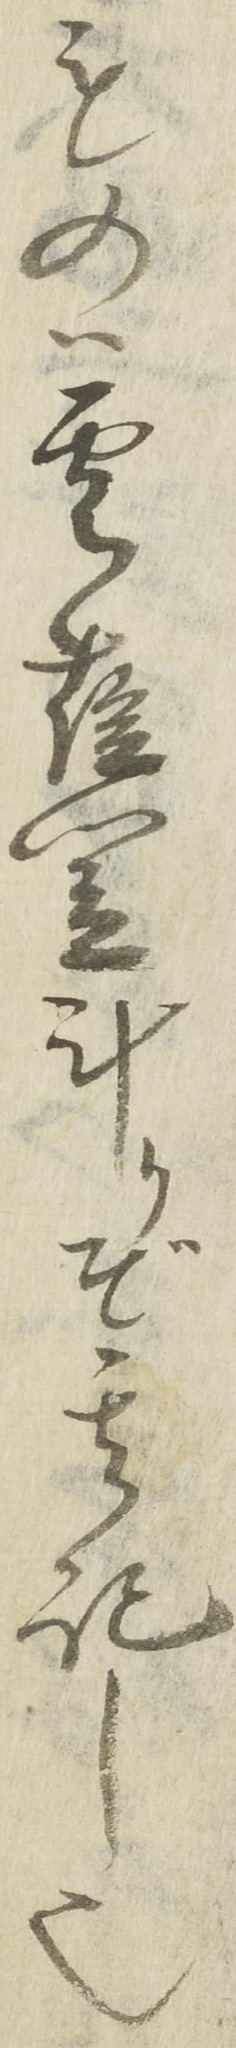ものは雲藺笠計りぞ其記し也
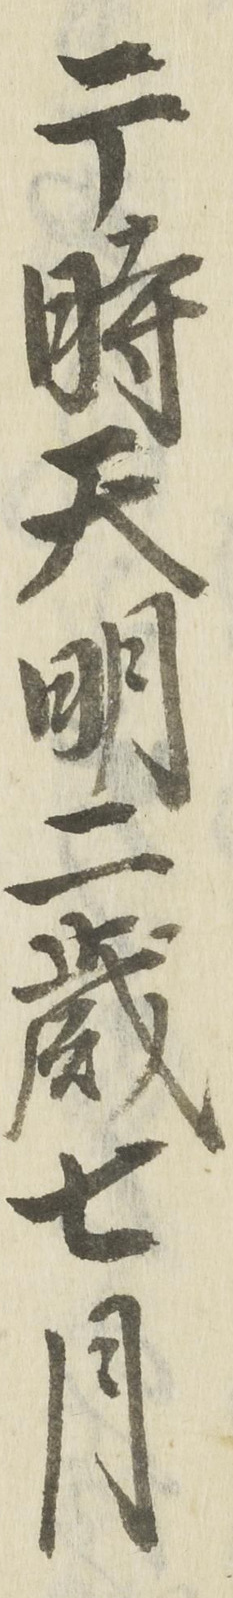于時天明二歳七月
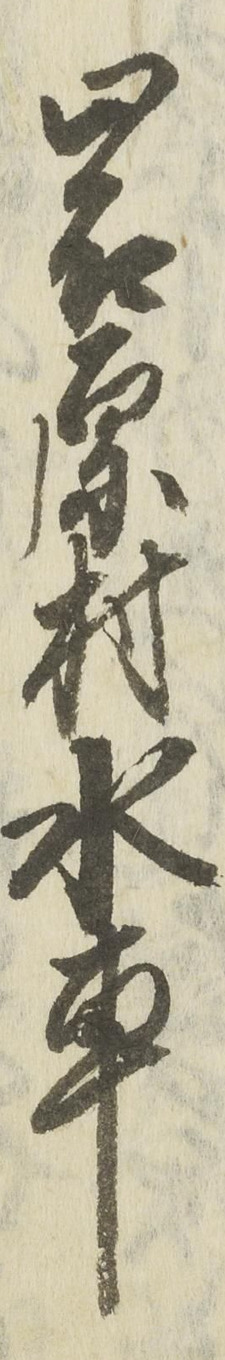岩原村水車

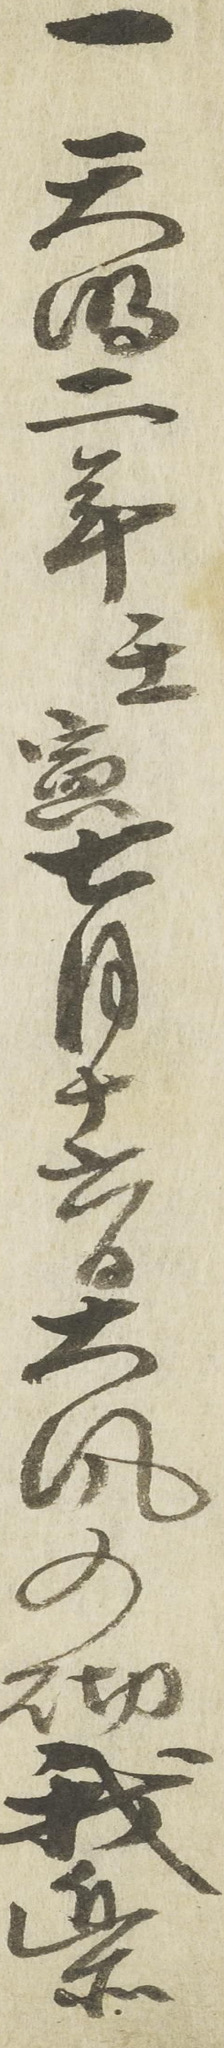一天明二年壬寅七月十六日大風の砌我近所
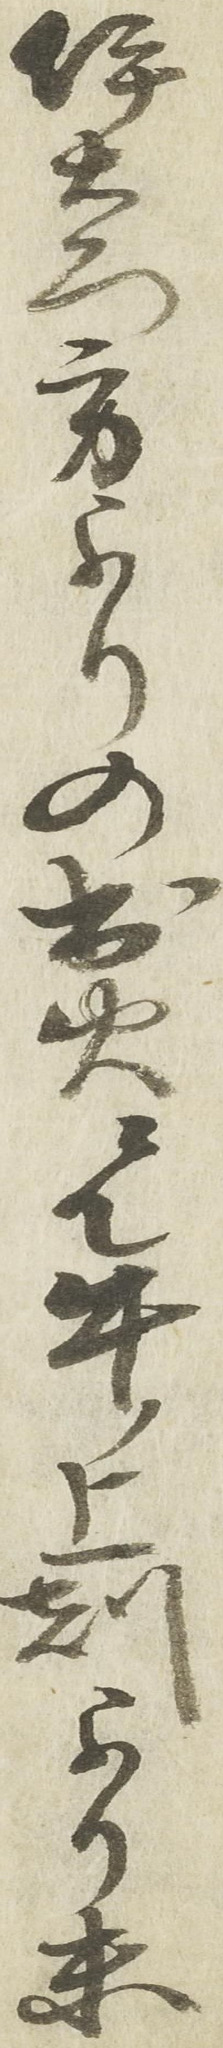伊右衛門方よりの出火ニて午ノ上刻より未
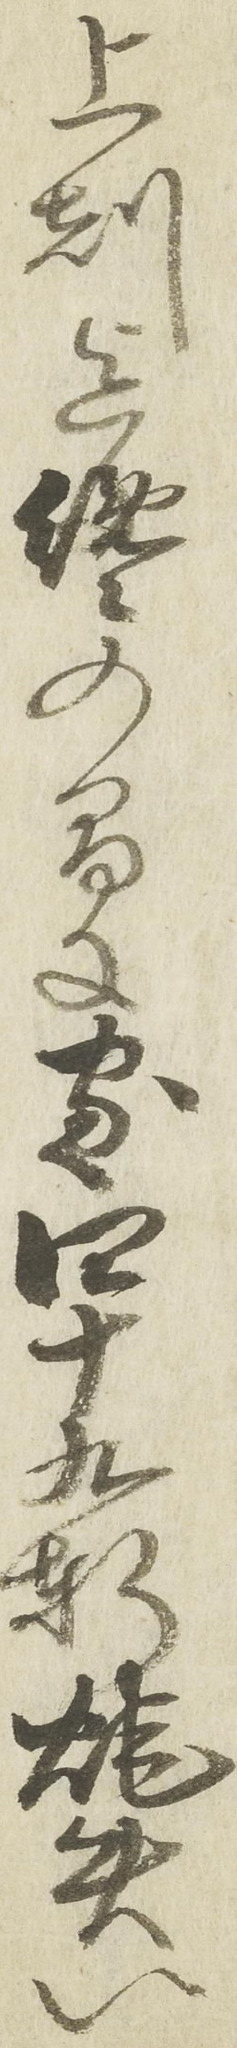上刻迄纔の間に家四十九軒焼失い
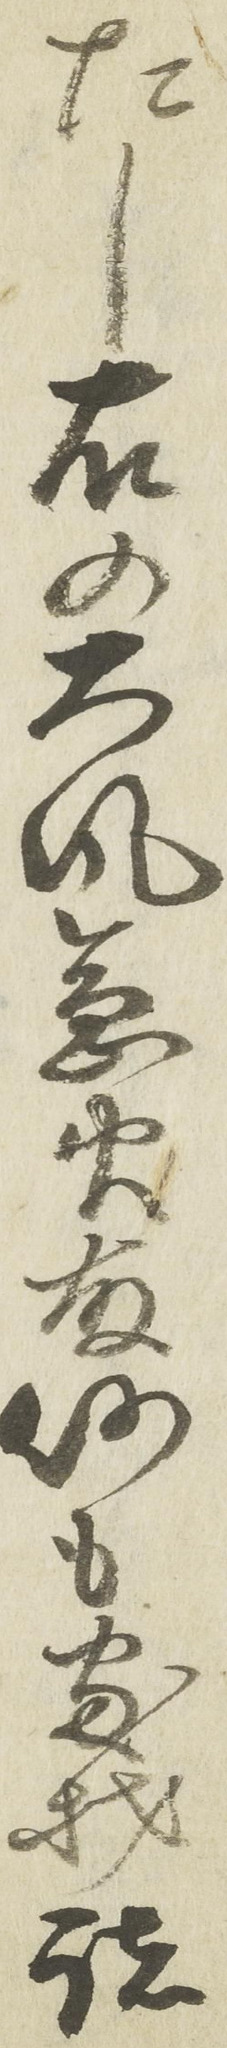たし右の大風急火故何も家材諸
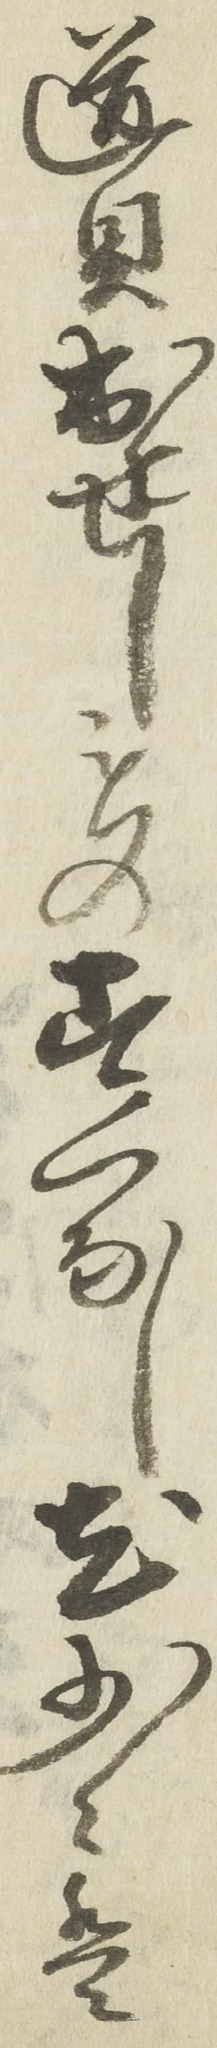道具出せしものすくなし尤も少〻は
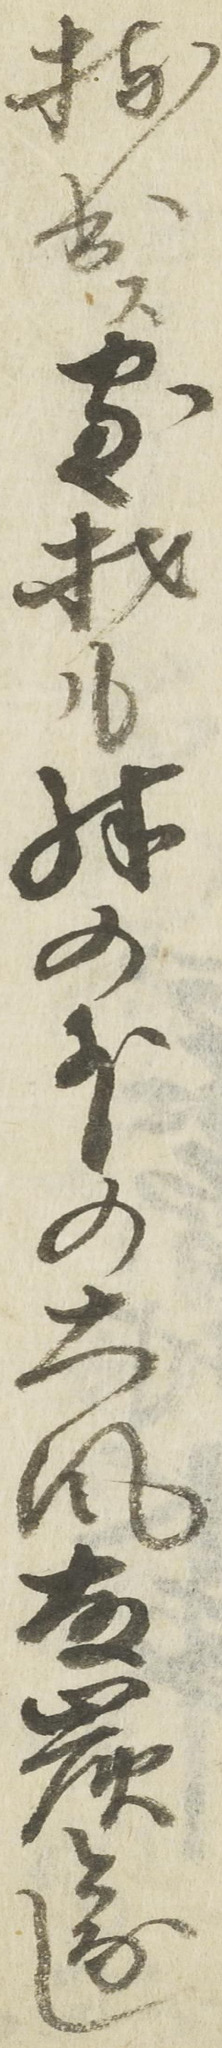持出ス家材も殊の外の大風故炭となし
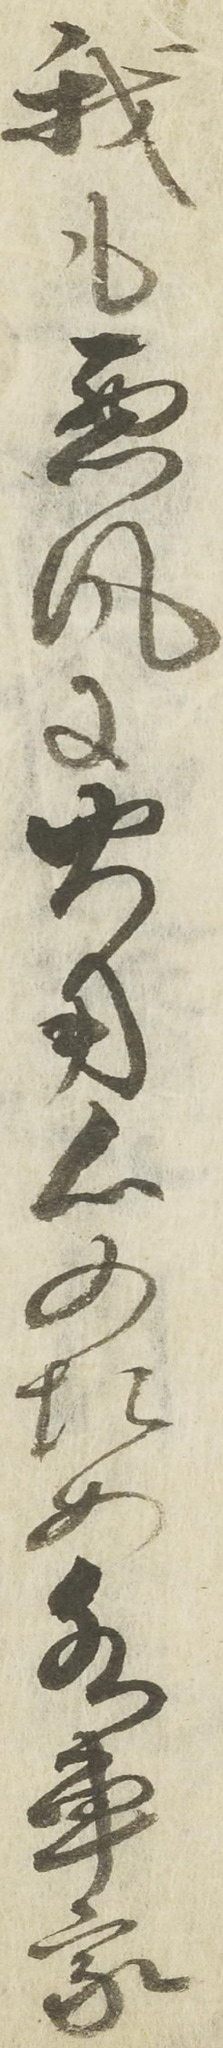我も悪風に火用心のため水車家
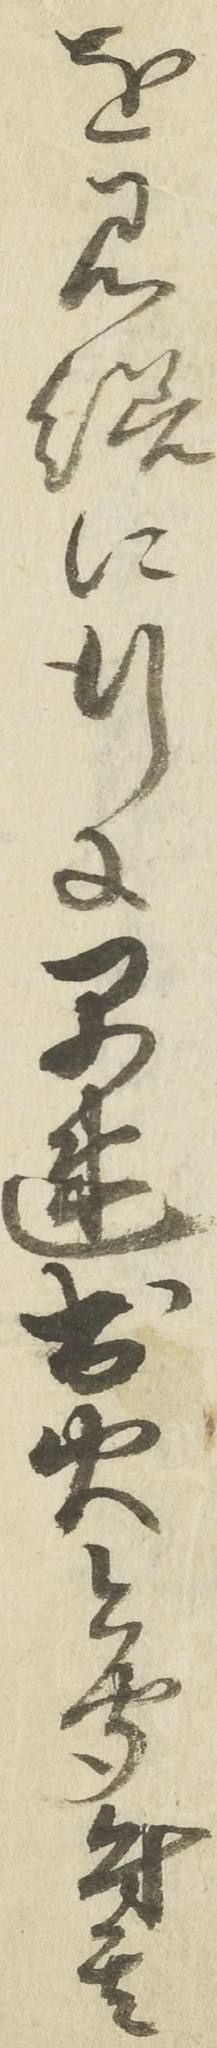を見繕に行に早速出火と聞付其
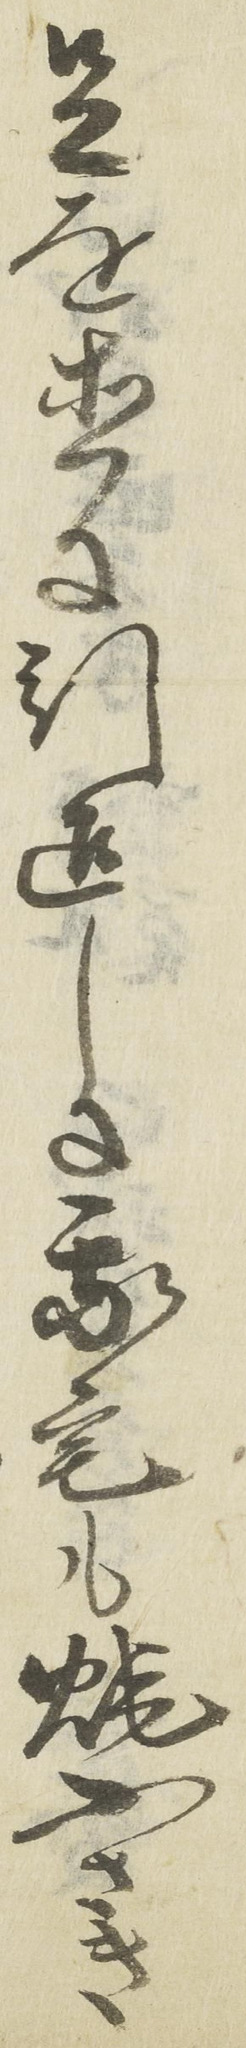足を直に引返しに我宅も焼ふさき
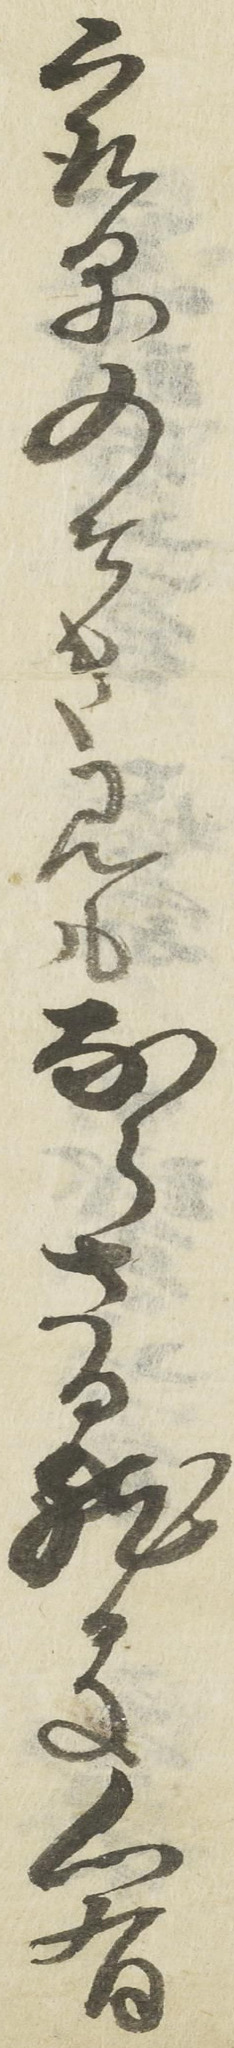最早のそき見もならさる然るに心有
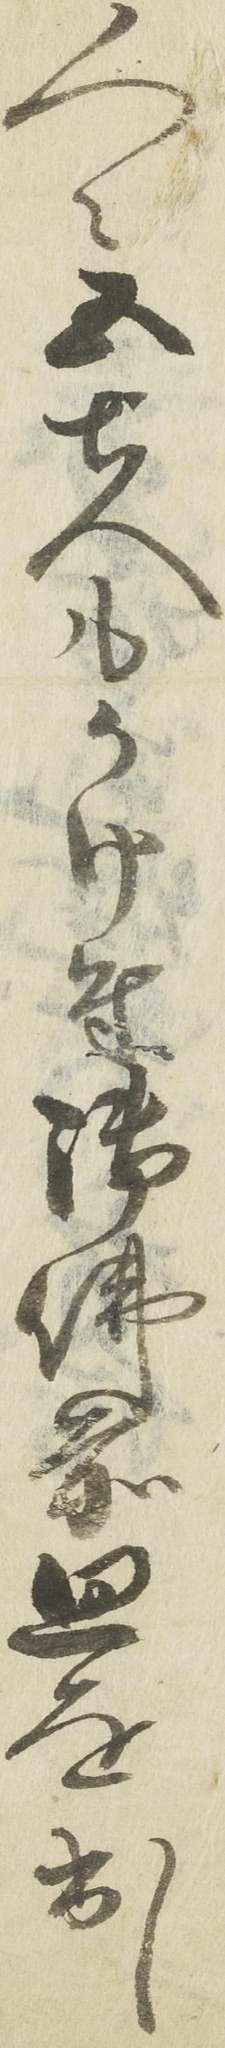人〻五七人もかけ付御佛前廻を出し
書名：後見笑
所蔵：東京大学地震研究所図書室 Earthquake Research Institute Library, The University of Tokyo, JAPAN
